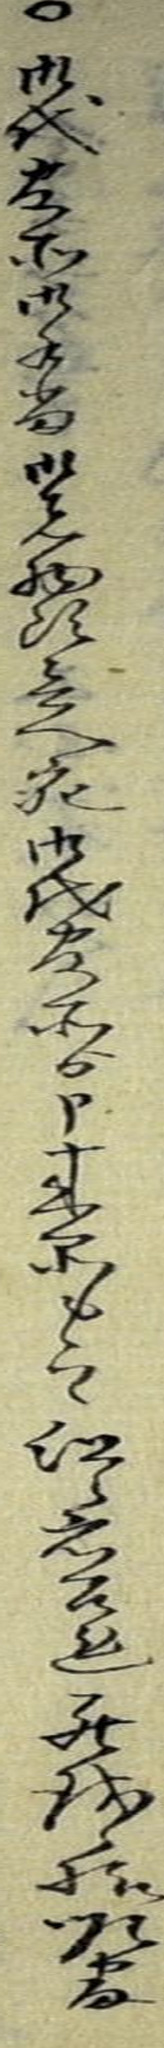〇御代官所御手当御先物頭壱人宛御代官所ゟ申来品も候ハヽ組之者召連罷越候様順番
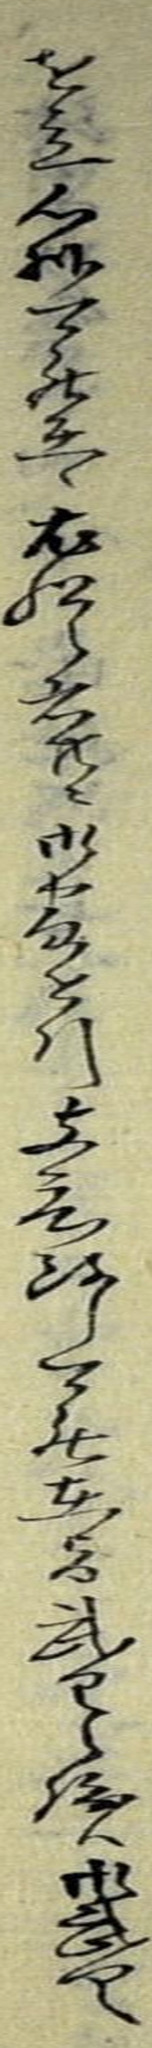を立心掛可罷在候尤組之者共ニ御番を引支度致し可罷在旨武具之儀ハ御武具
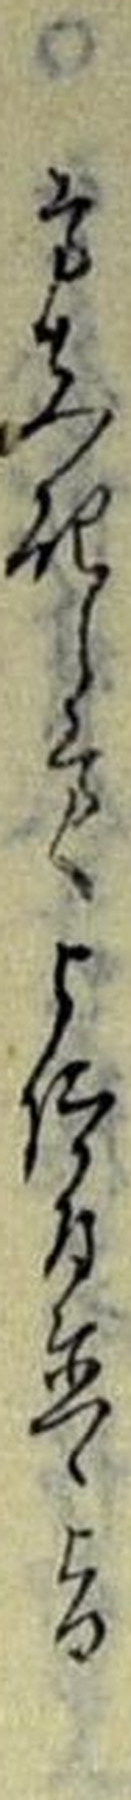方支配之方へ被仰付置候旨
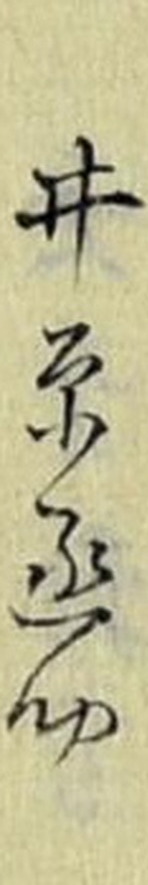井原丞助
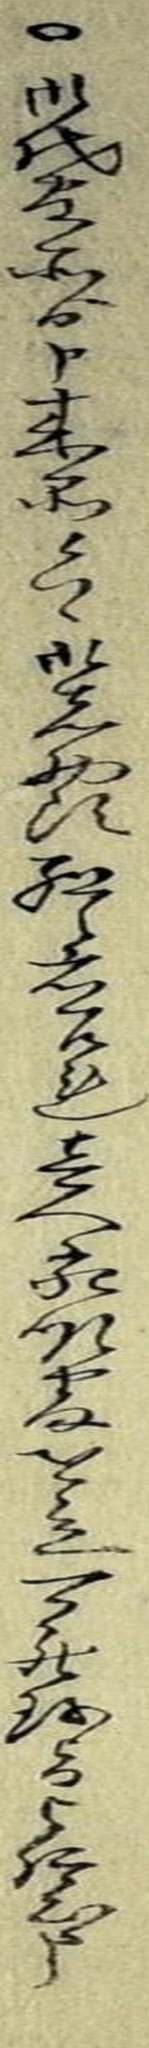〇御代官所ゟ申来品候ハヽ御先物頭組之者召連壱人宛順番を立可罷越旨被仰出申
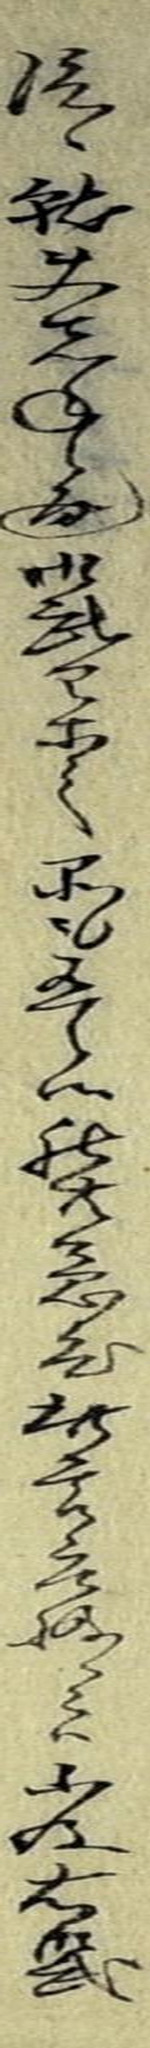渡候就夫先年之通御武具等之品も有之候然共急度此節取扱候ニハ不及右御武
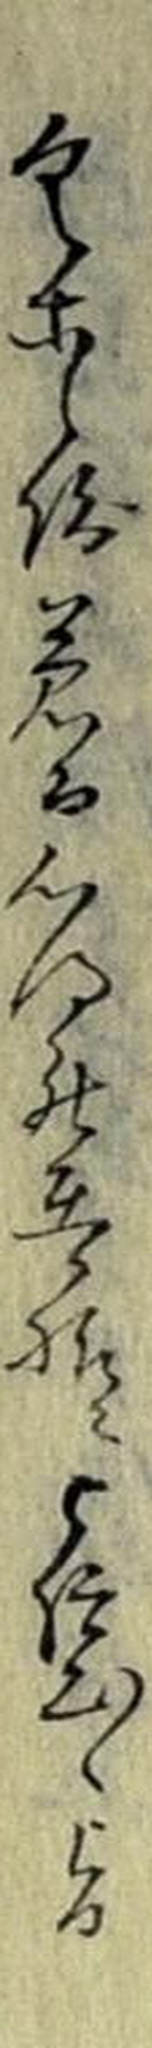具等之儀兼而心得罷在候様ニ被仰出候旨
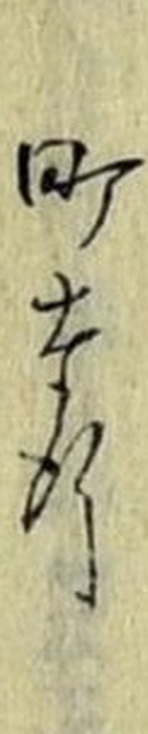町奉行
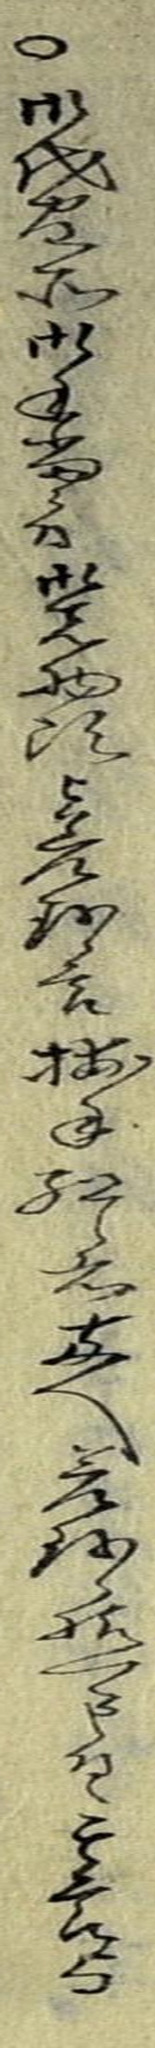〇御代官所御手当ニ付御先物頭被差越候節捕手組之者両人差越候様可申付候其節与
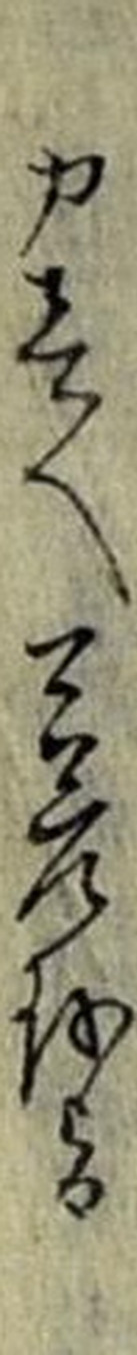力壱人可差越旨
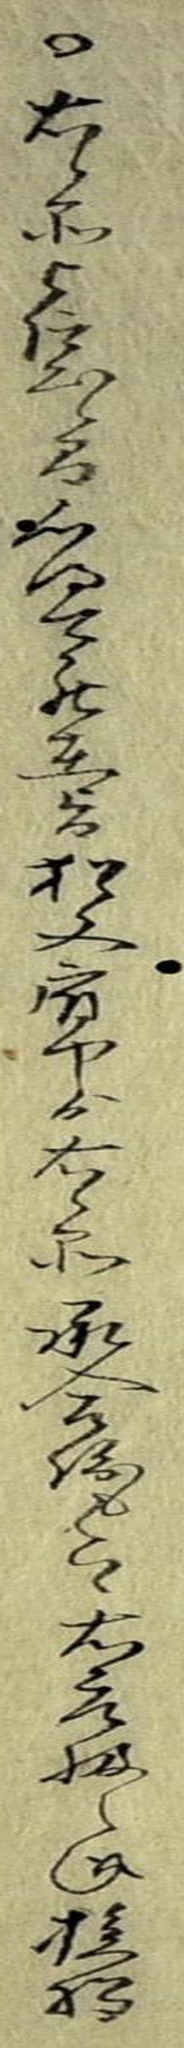〇右之品被仰出候間心得可罷在旨猶又府中ゟ右之品承合儀も候ハヽ右取扱之趣挨拶
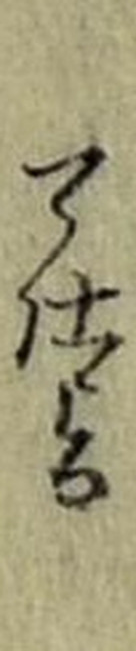可仕旨

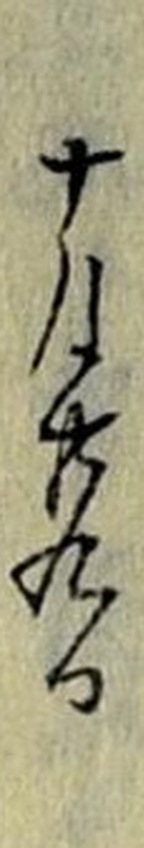十月廿九日
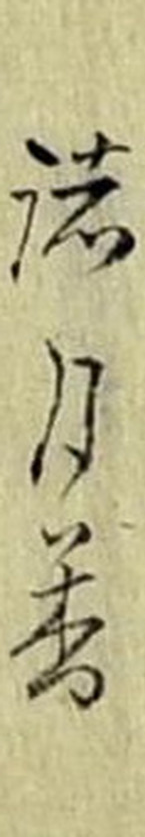諸月番
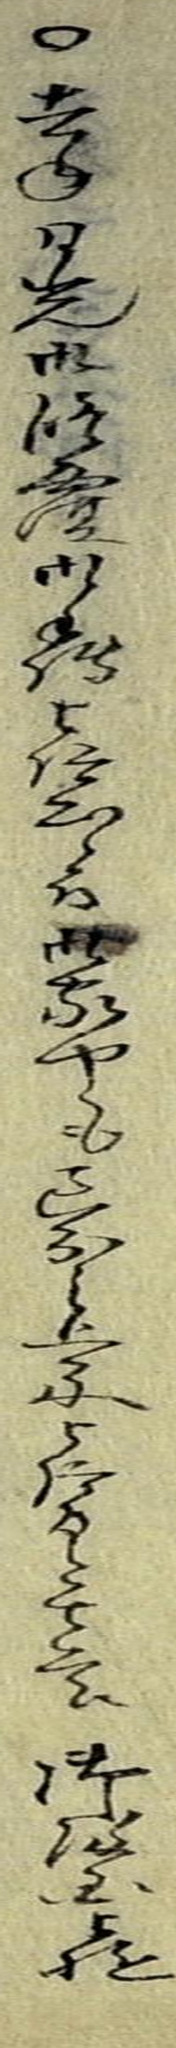〇去年日光御修覆御手伝被仰出候ニ付御家中へも過分之上米被仰付候其節御帰国被遊
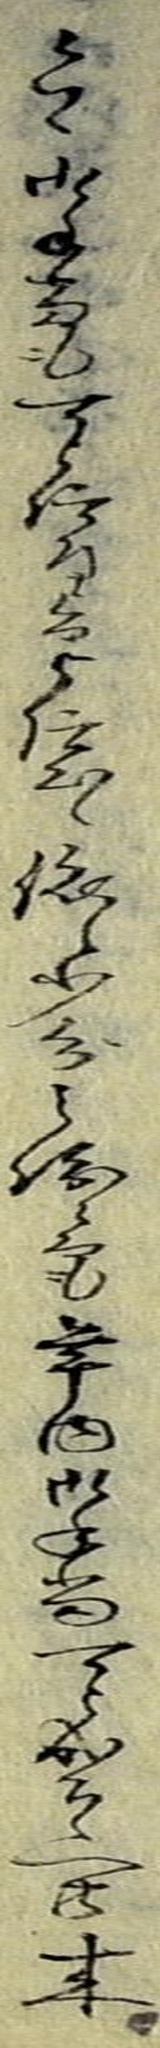候ハヽ御手当も可被仰付旨被仰出候依之少分之儀ニ而も年内御手当可被成下候へ共来
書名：命令之部 一
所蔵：福井県文書館 Fukui Prefectural Archives
